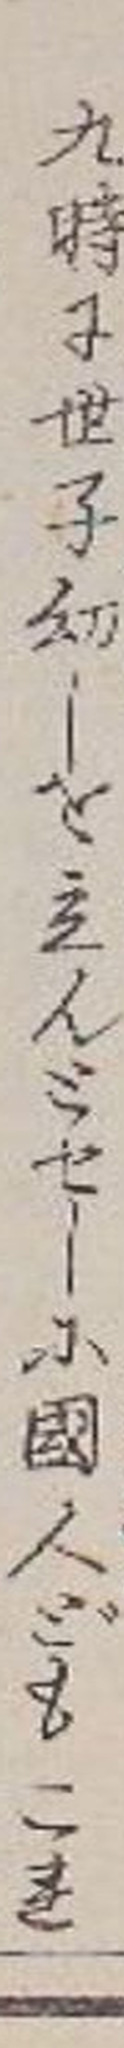九時に、世子幼しを立んとせしに、国人どもこれ
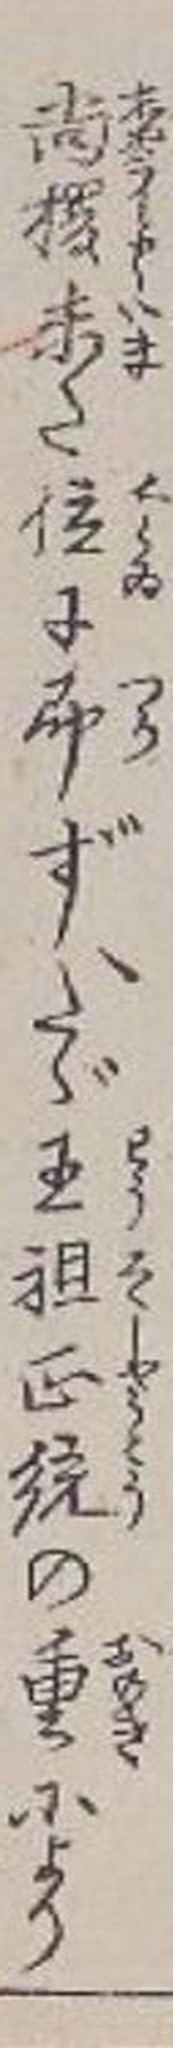尚稷未た位に即ず、たゞ王祖正統の重により
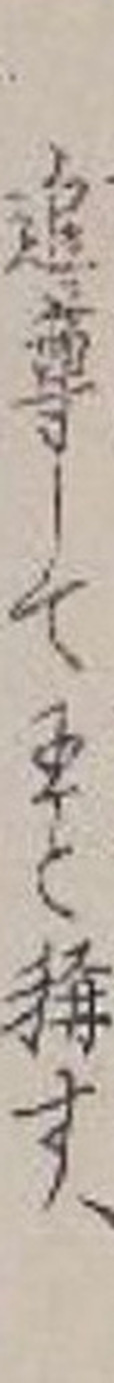追尊して王と称す、

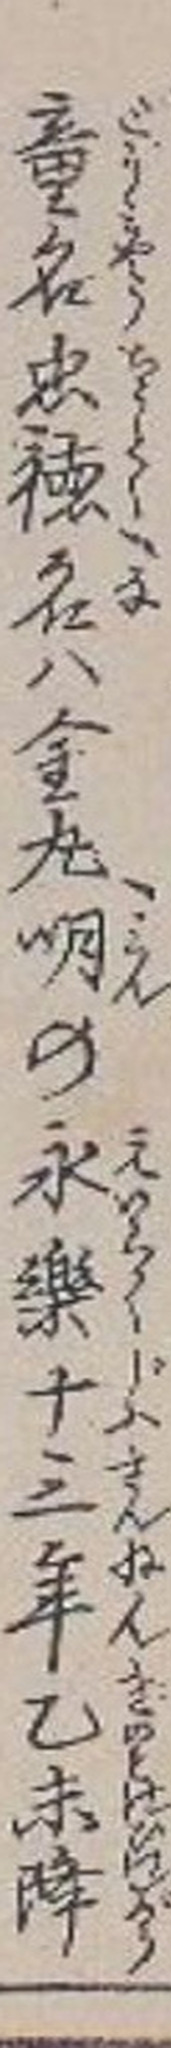童名忠徳、名は金丸、明の永楽十三年乙未降
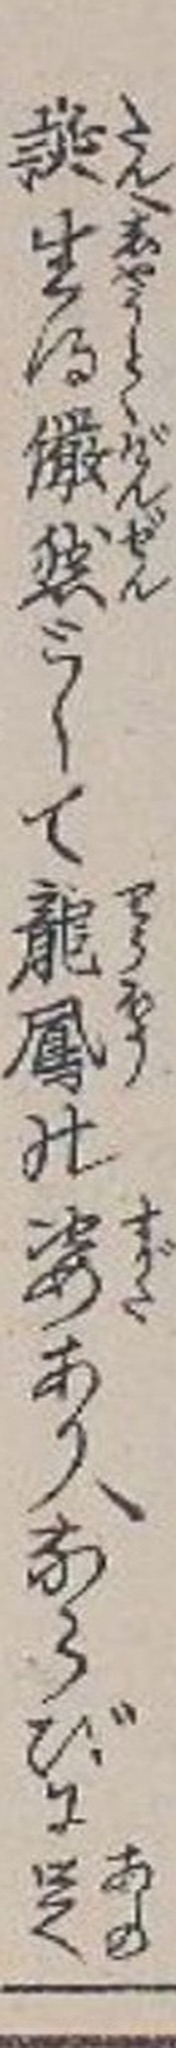誕、生得儼然として龍鳳の姿あり、ならびに足
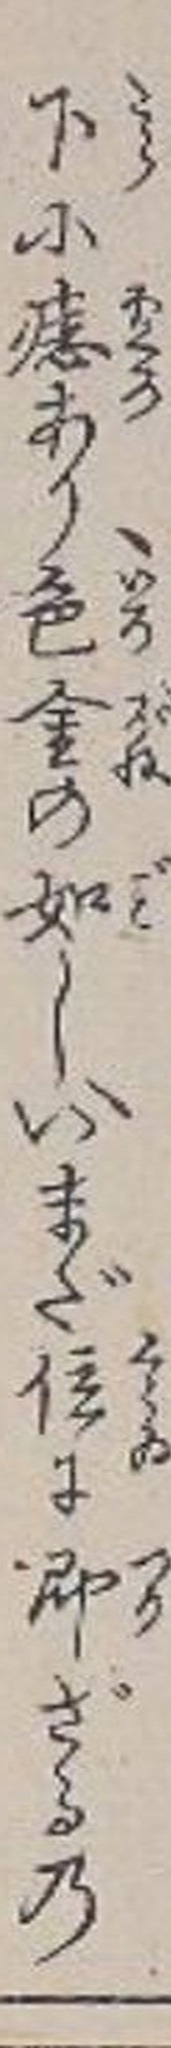下に痣あり、色金の如し、いまだ位に即ざるの
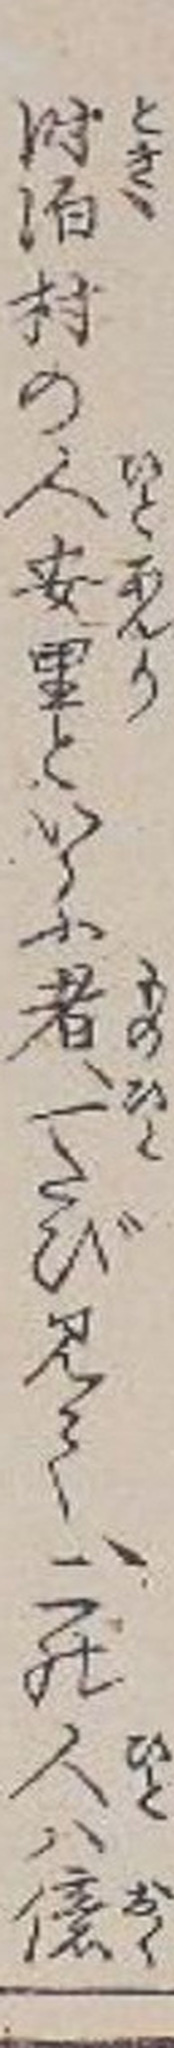時、泊村の人安里といふ者、一たび見て、この人は億
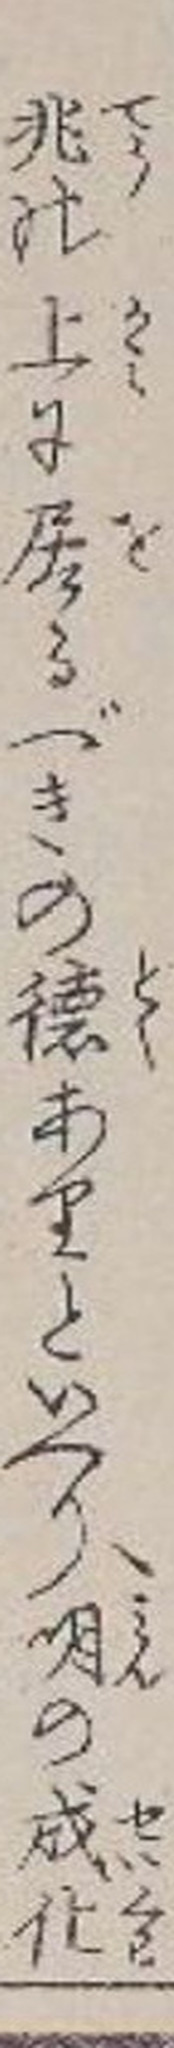兆の上に居るべきの徳ありといへり、明の成化
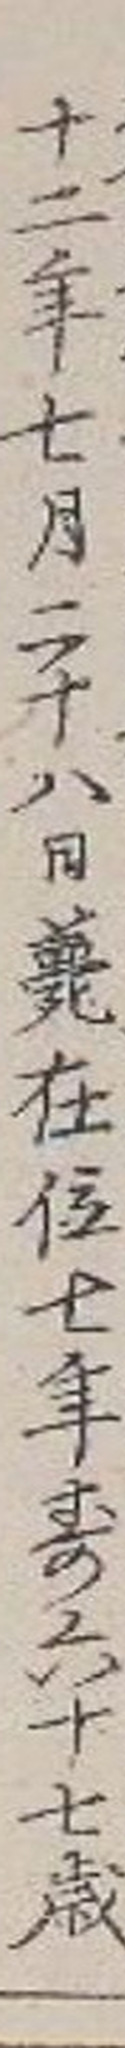十二年七月二十八日薨、在位七年寿六十七歳、
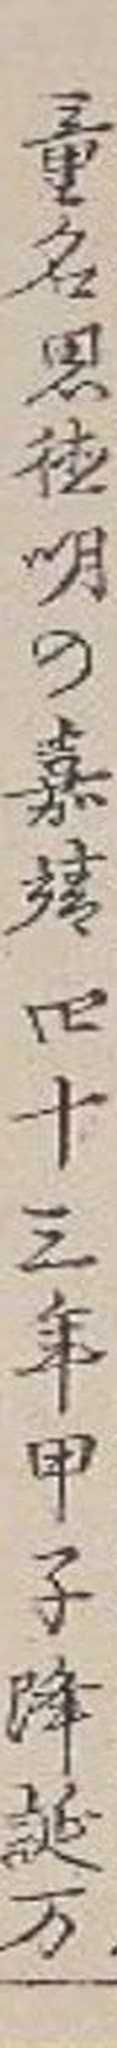童名思徳、明の嘉靖四十三年甲子降誕、万
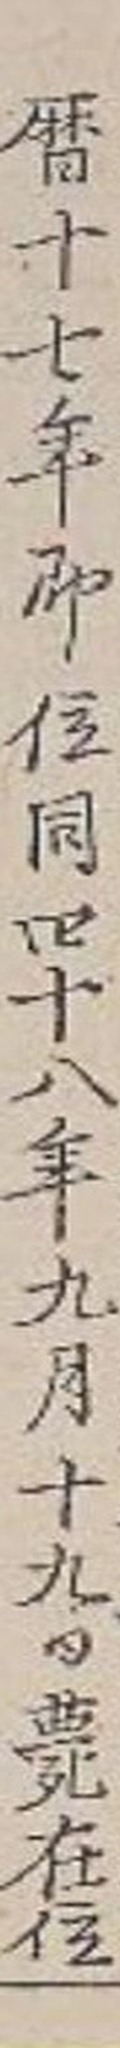暦十七年即位、同四十八年九月十九日薨、在位
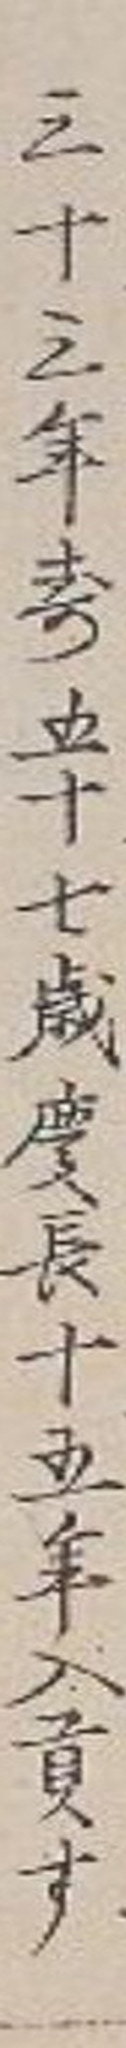三十三年、寿五十七歳、慶長十五年入貢す、

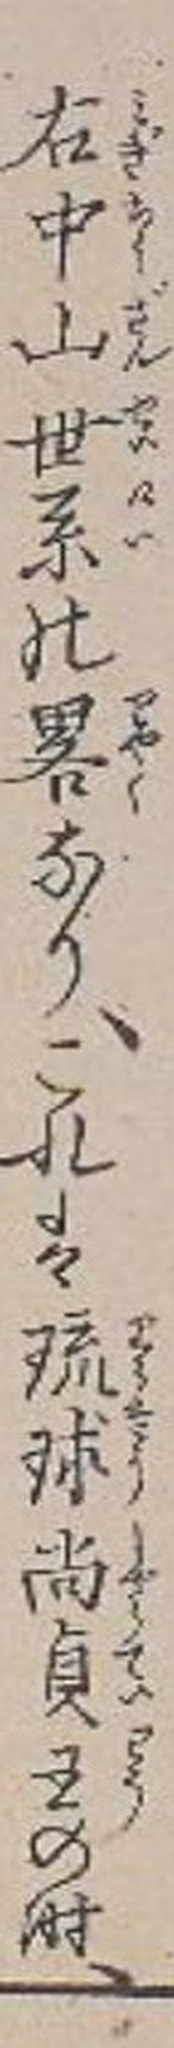右中山世系の略なり、これは琉球尚貞王の時、
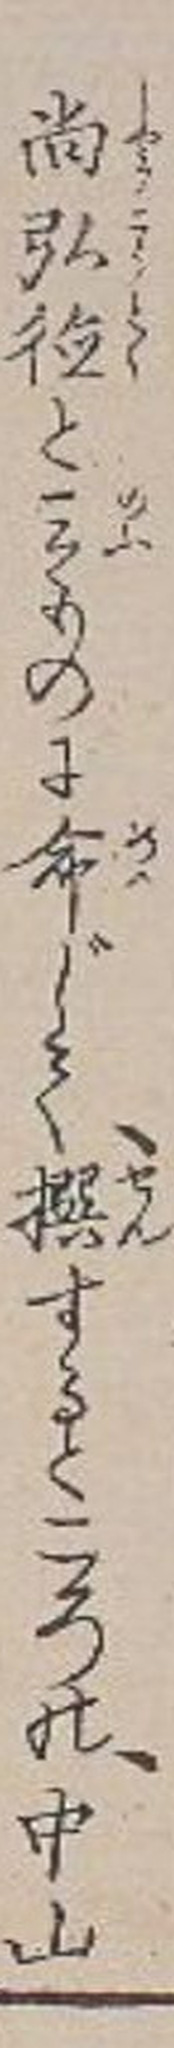尚弘徳と云ものに命じて、撰するところの、中山
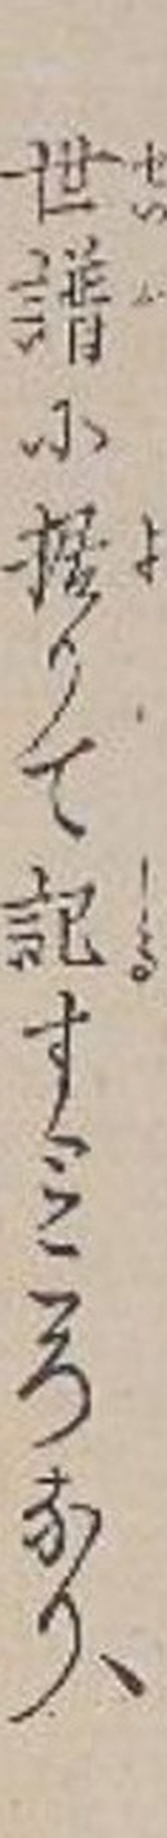世譜に据りて記すところなり、
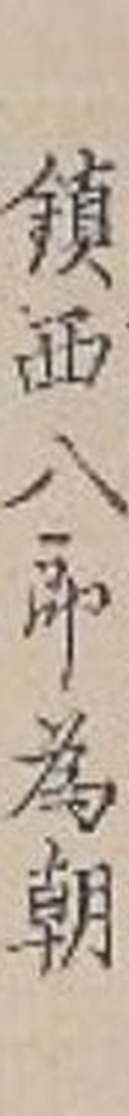鎮西八郎為朝
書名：琉球入貢紀略
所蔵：University of the Ryukyus Library
